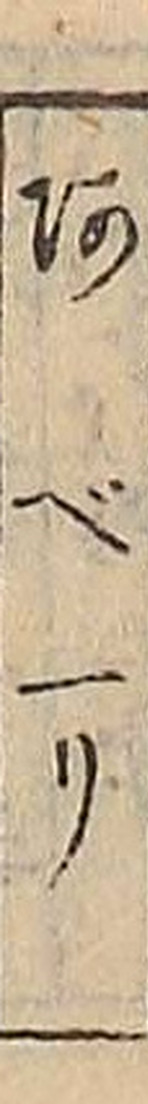あべ一リ
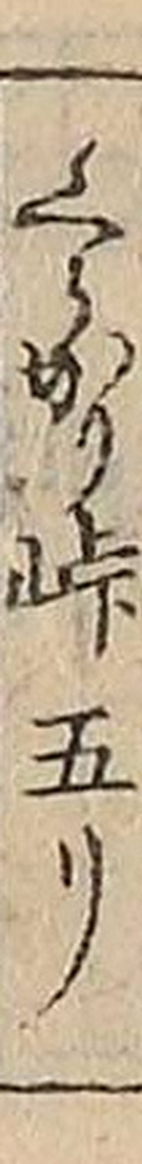くらかり峠五リ
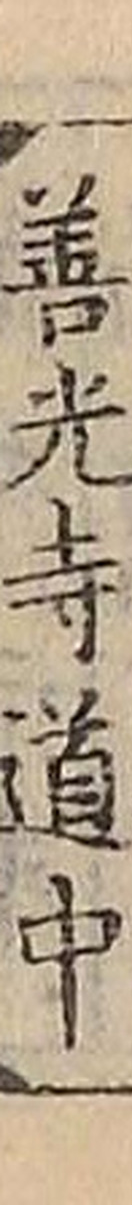善光寺道中
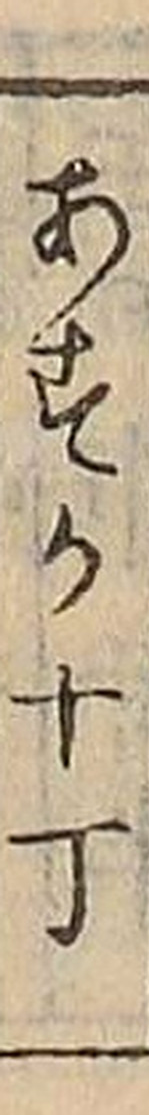あすか十丁
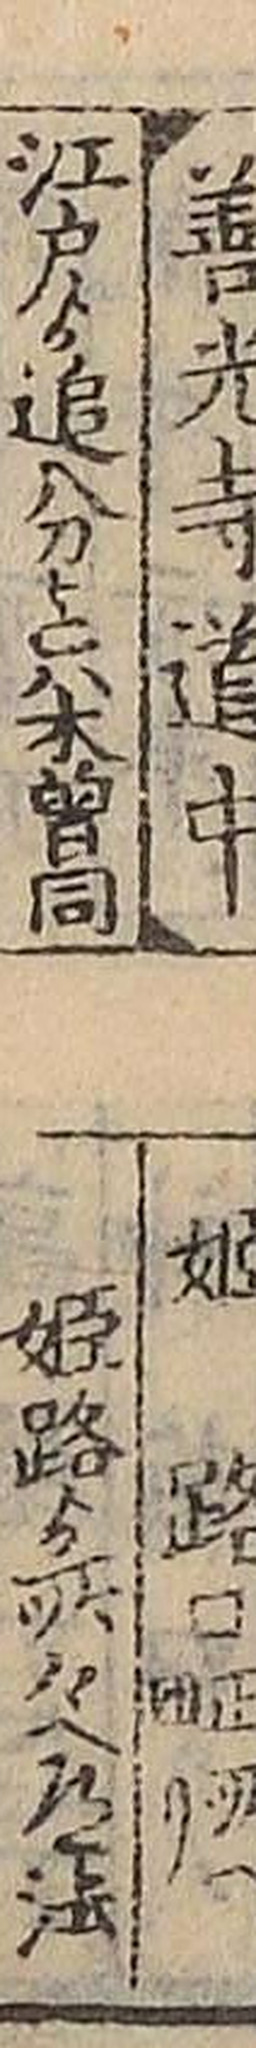江戸ゟ追分迄は木曽同
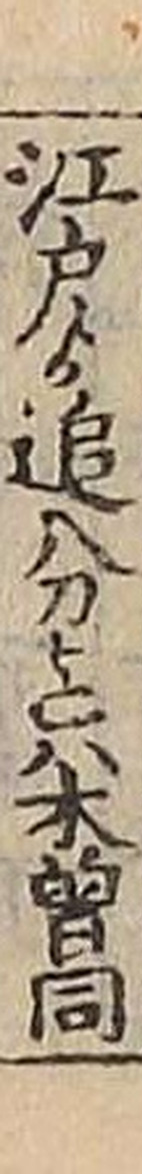江戸ゟ追分迄は木曽同
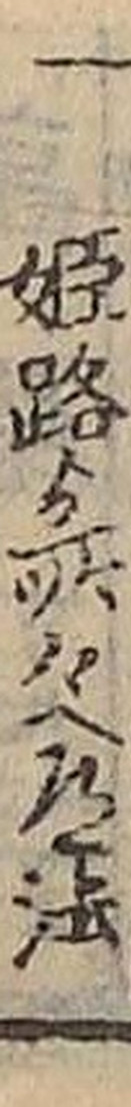姫路ゟ所々へ道法
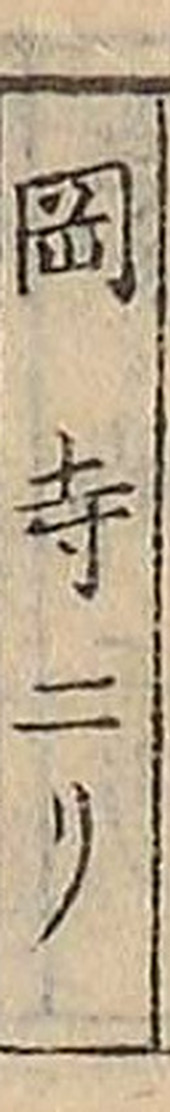岡寺二リ
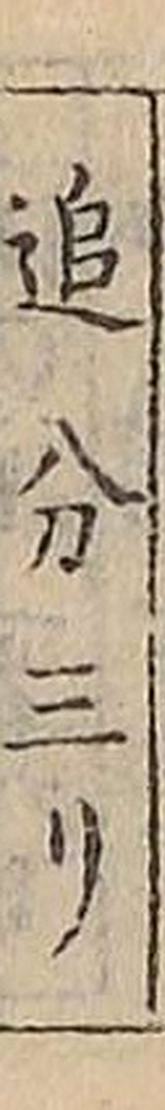追分三リ
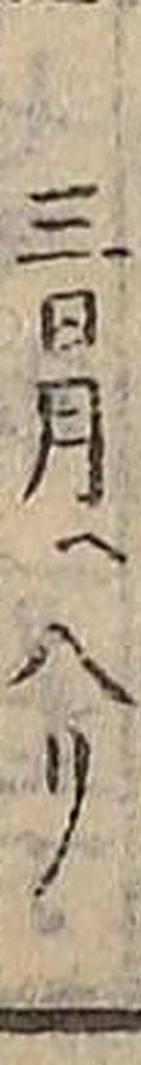三日月へ八リ
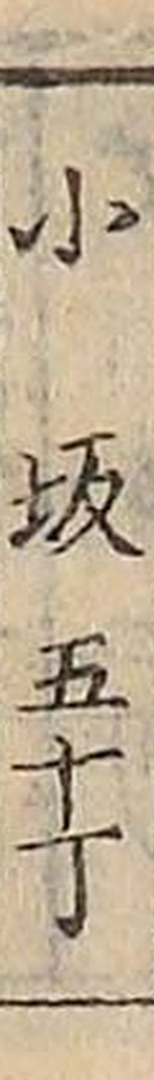小坂五十丁
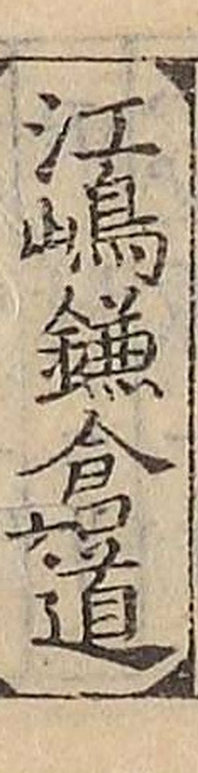江島鎌倉道
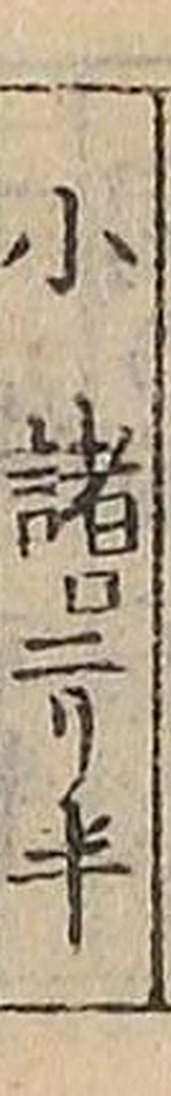小諸▫二リ半
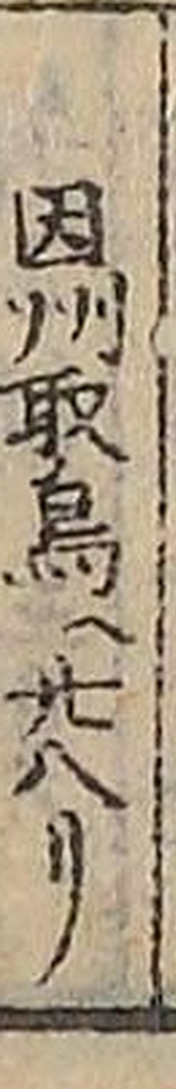因州取鳥へ廿八り
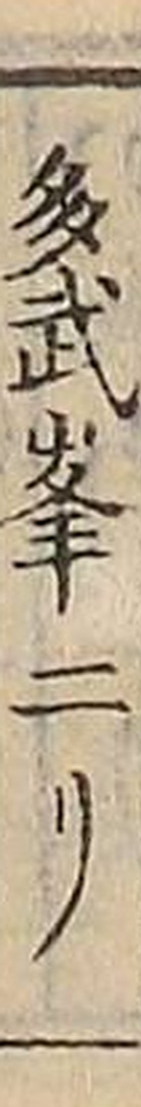多武峰二リ
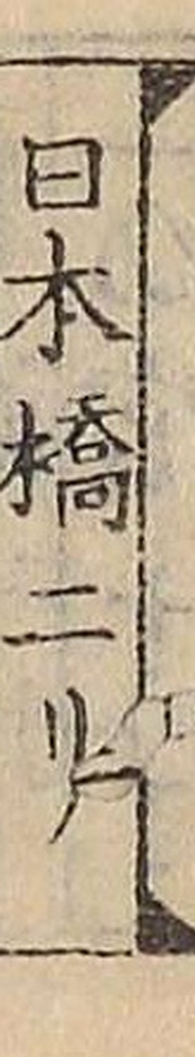日本橋二リ
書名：旅行用心集
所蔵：神戸大学附属図書館 国文学研究資料館
